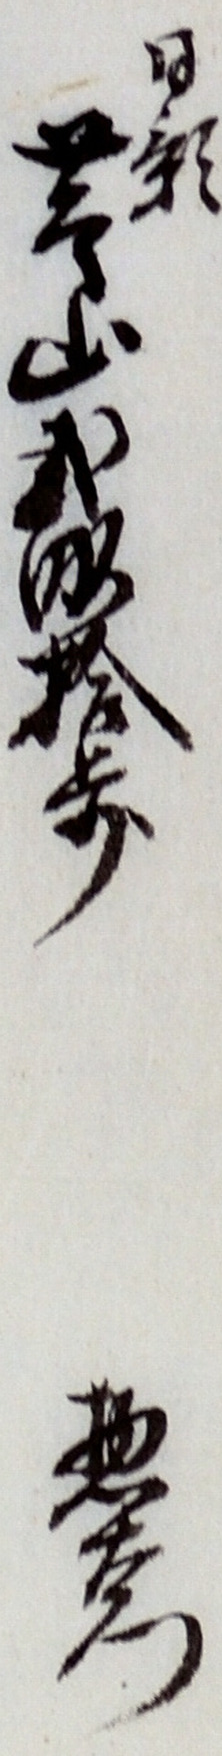芝山弐畝拾歩惣右衛門
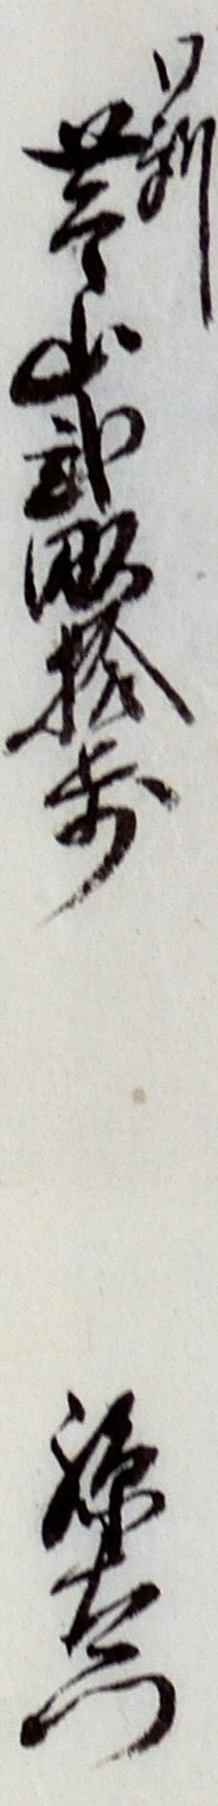芝山弐畝拾歩惣右衛門
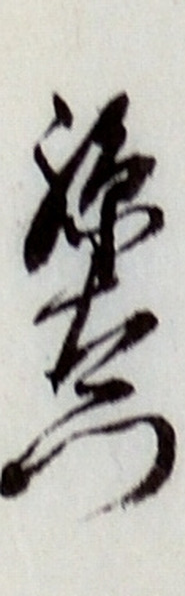源右衛門
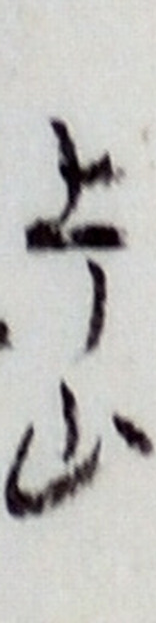上ノ山
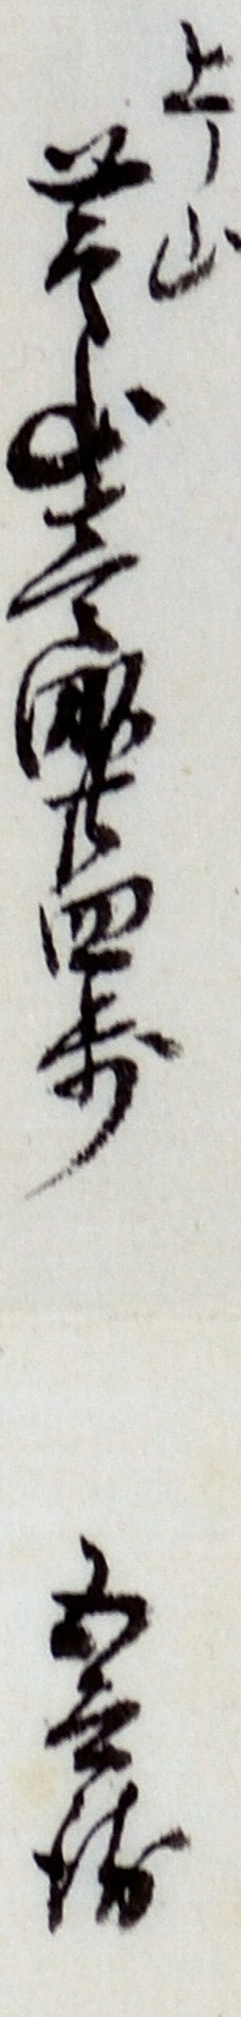芝山壱畝廿四歩五兵衛
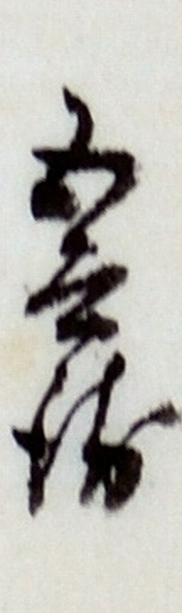甚兵衛
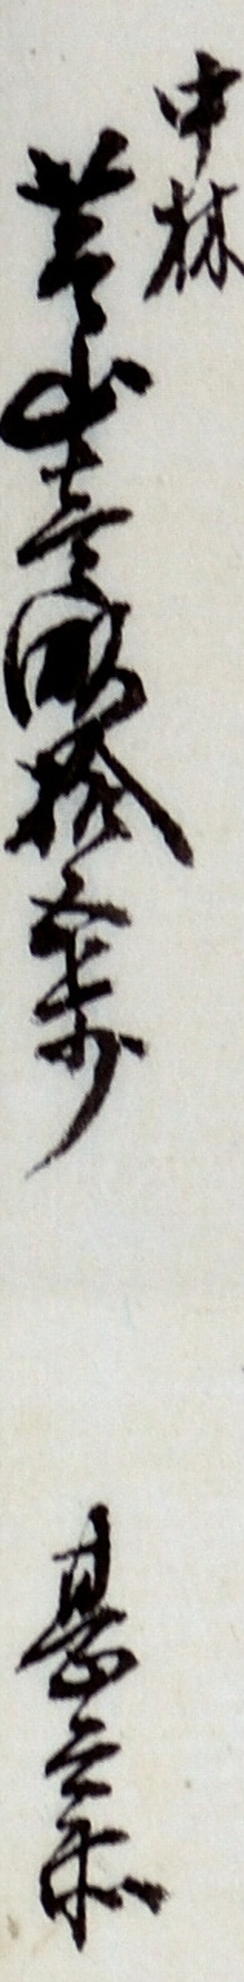芝山壱畝拾五歩甚兵衛
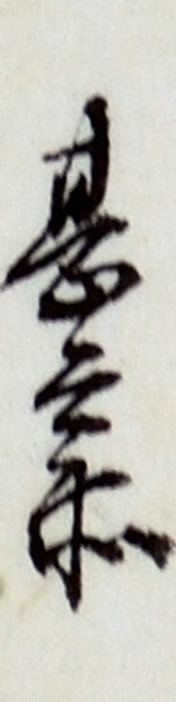甚兵衛
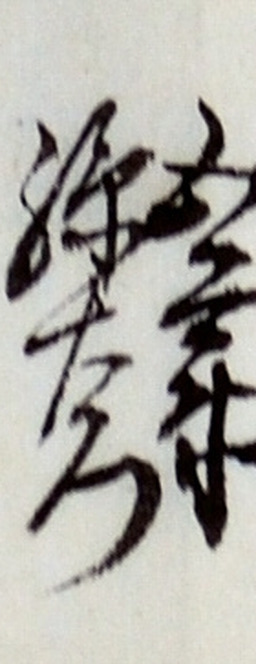源右衛門
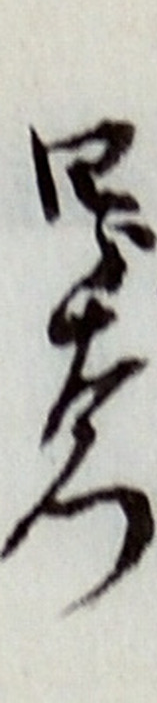四郎右衛門
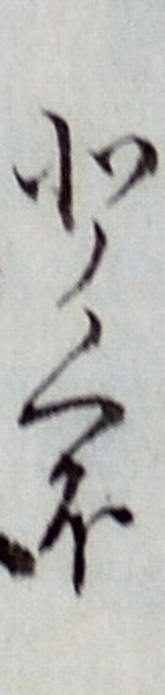北ノくほ
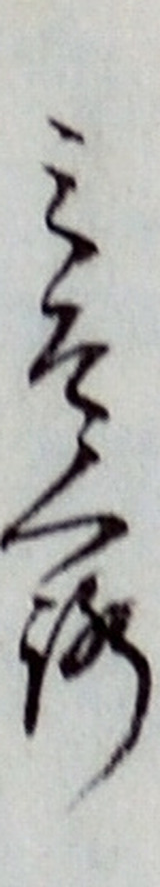みそくろ
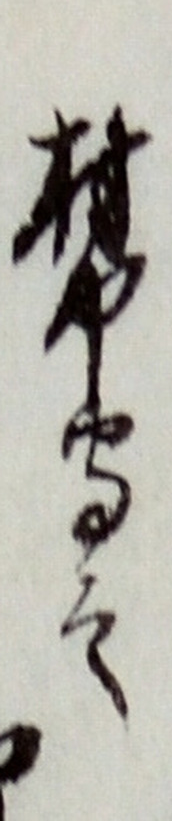村中守之
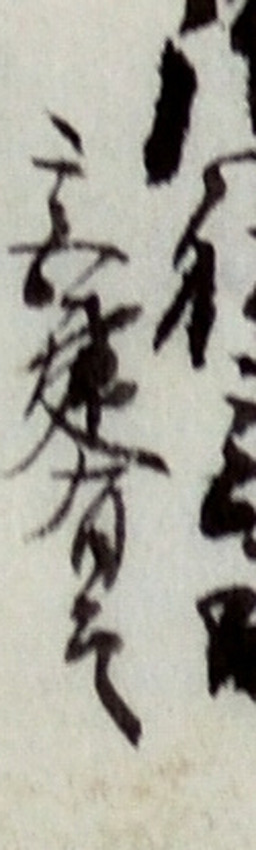宮建有之
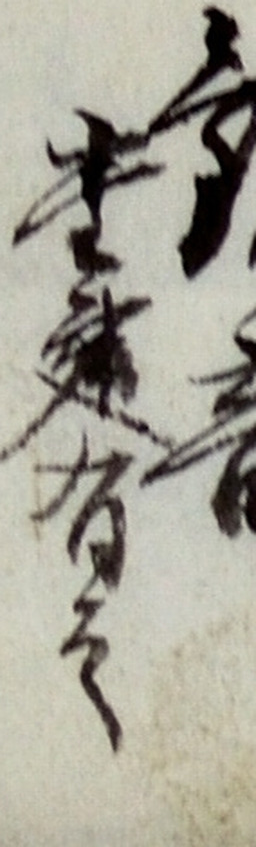宮建有之

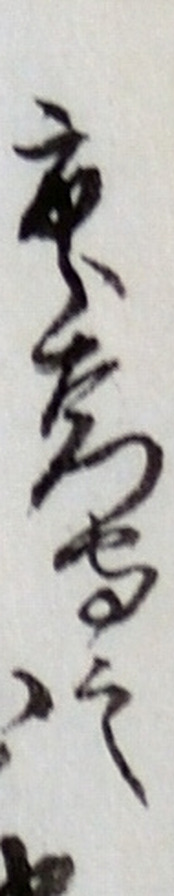市郎右衛門守之
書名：御領分中山林社地手控
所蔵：伊那市立高遠町図書館・合同会社AMANE
